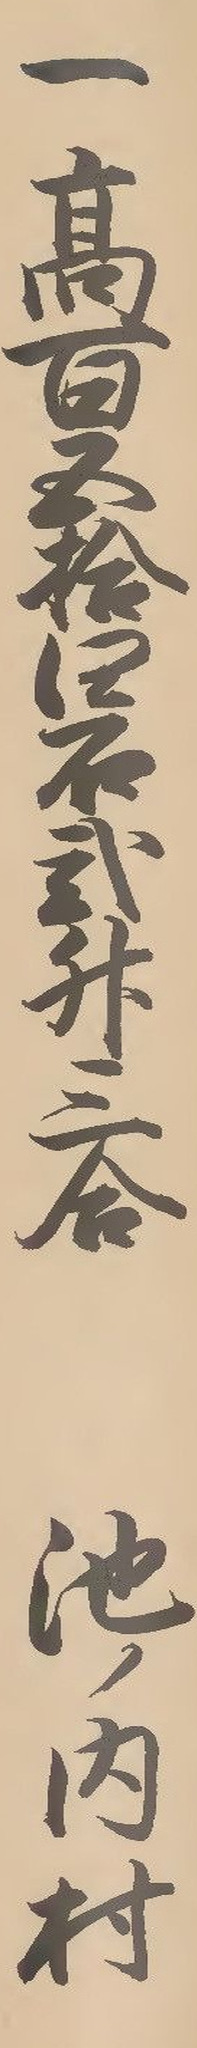一髙百五拾四石弐升三合池ノ内村
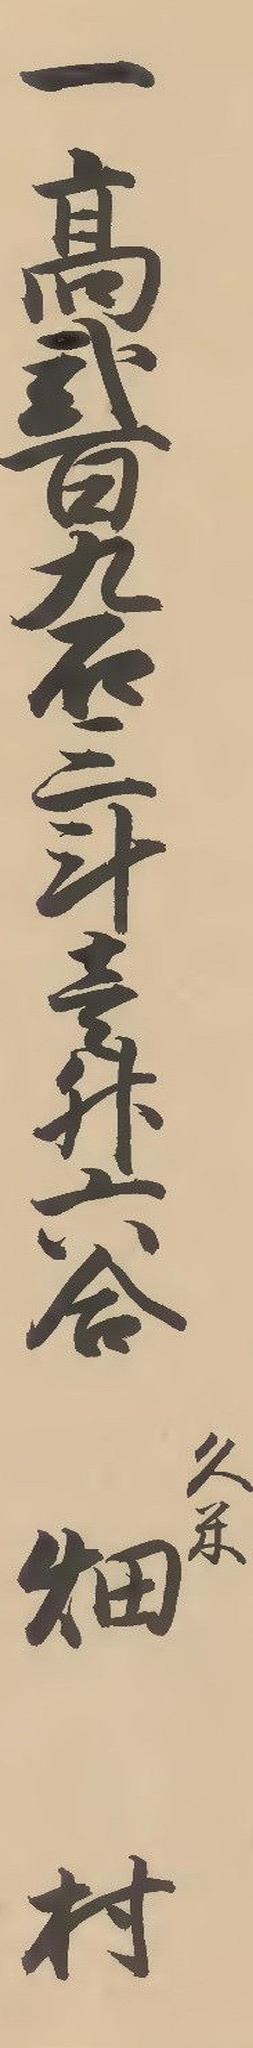一髙弐百九石三斗壱升六合畑村
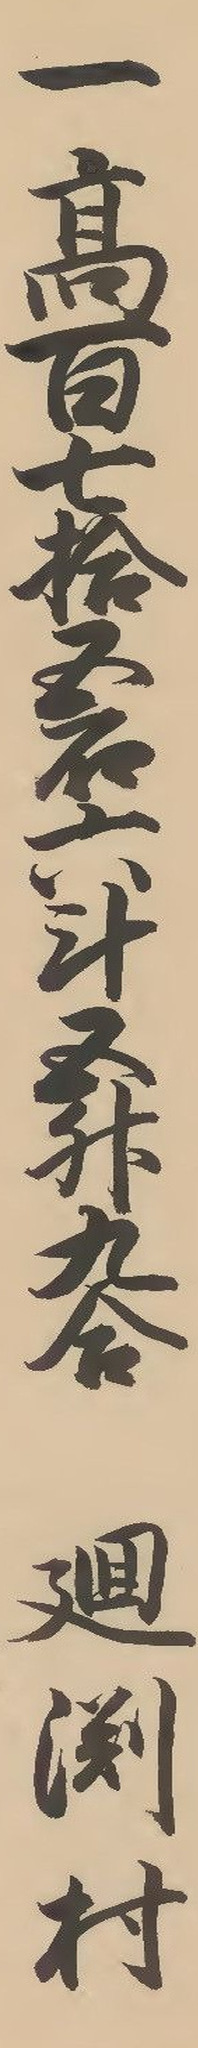一髙百七拾五石六斗五升九合廻渕村
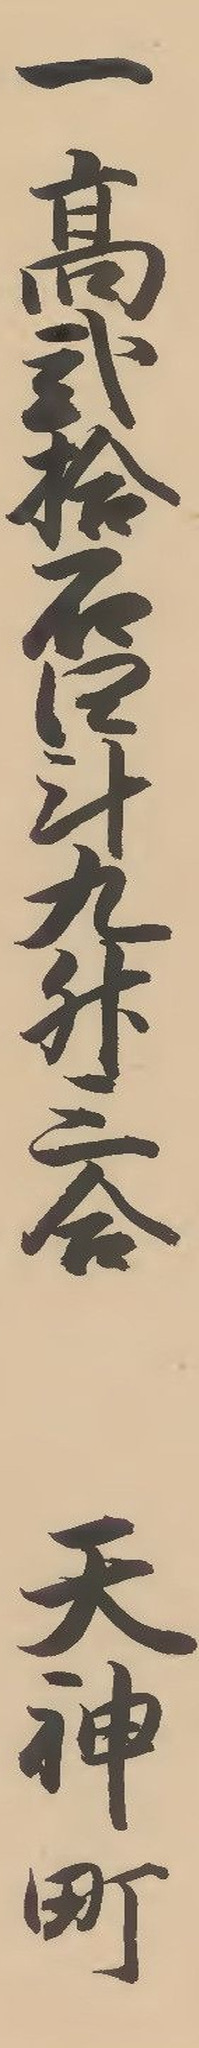一髙弐拾石四斗九升三合天神町

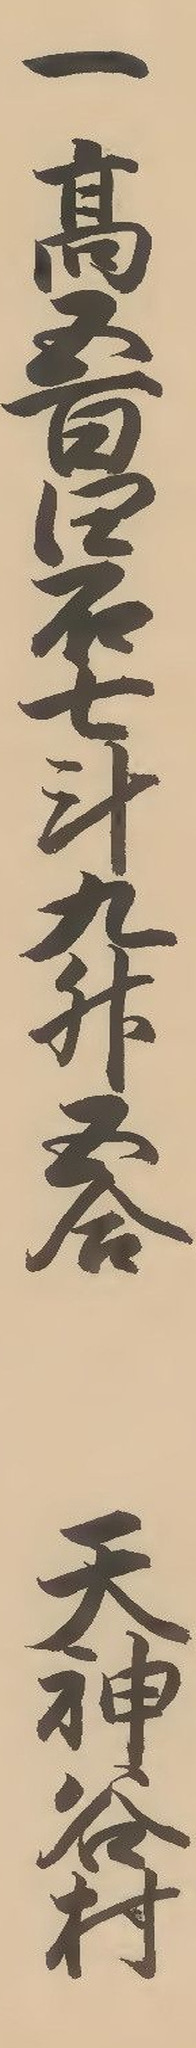一髙五百四石七斗九升五合天神谷村
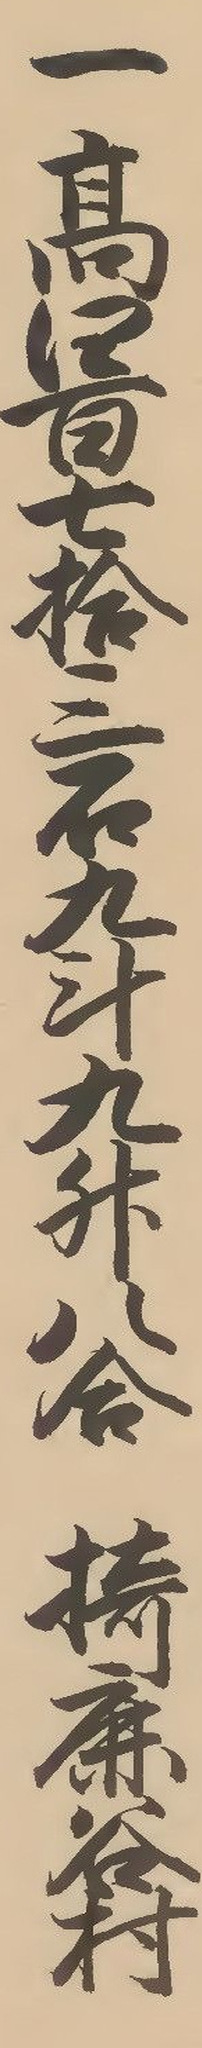一髙四百七拾三石九斗九升八合椅鹿谷村
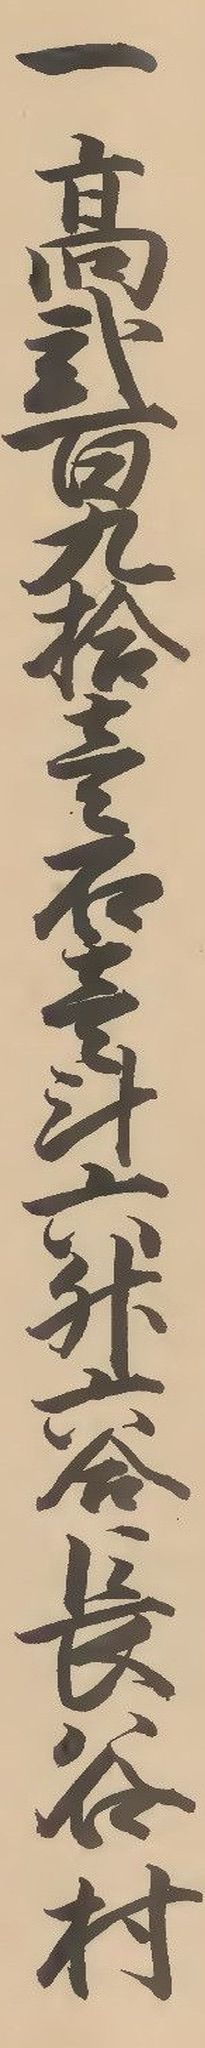一髙弐百九拾壱石壱斗六升六合長谷村
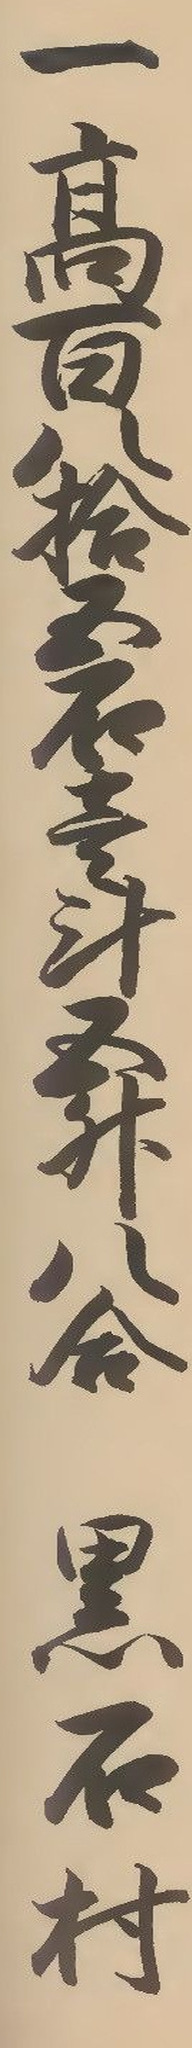一髙百八拾五石壱斗五升八合黑石村
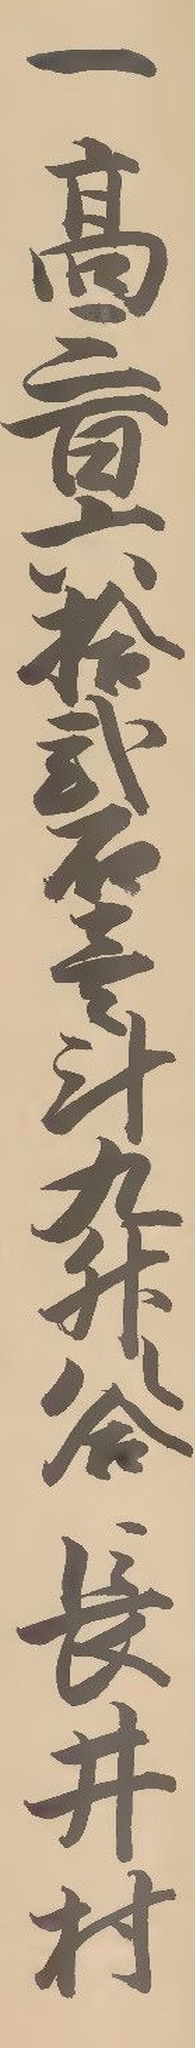一髙三百六拾弐石壱斗九升八合長井村
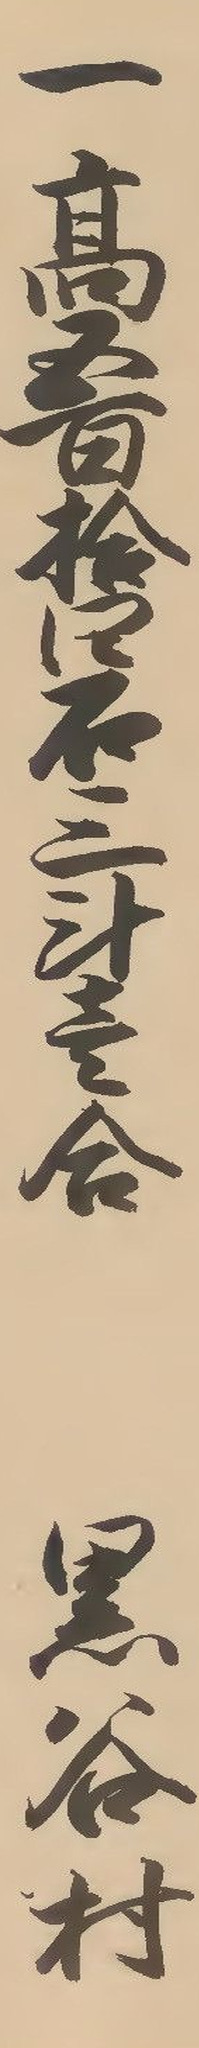一髙五百拾四石三斗壱合黑谷村
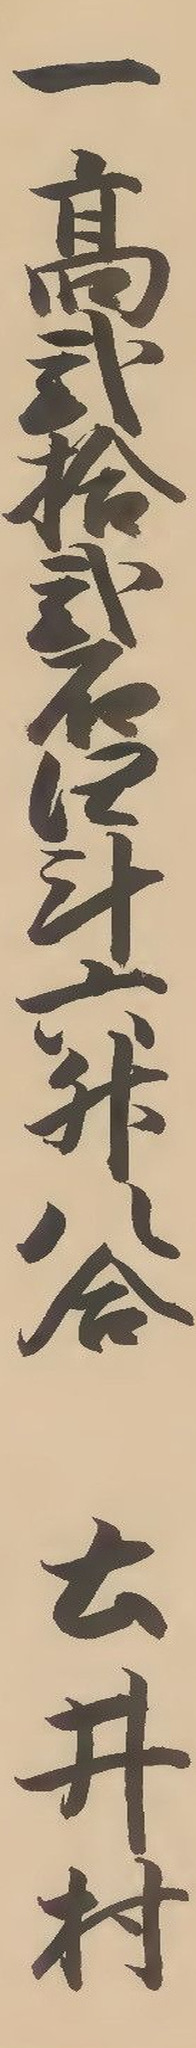一髙弐拾弐石四斗六升八合土井村
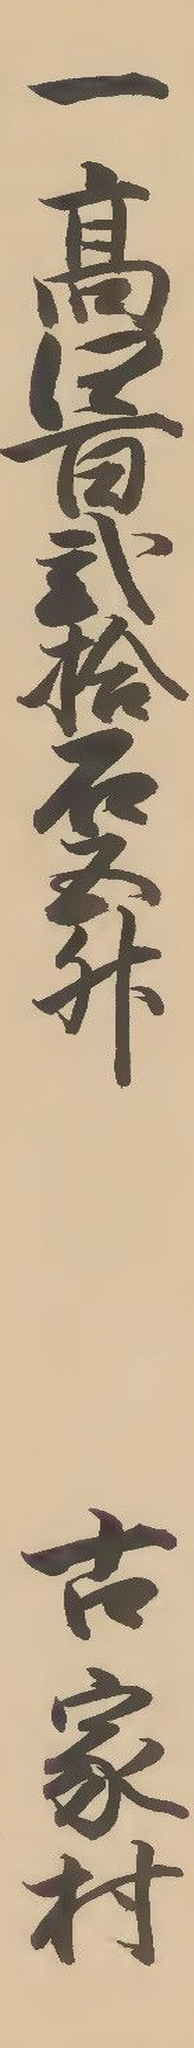一髙四百弐拾石五升古家村

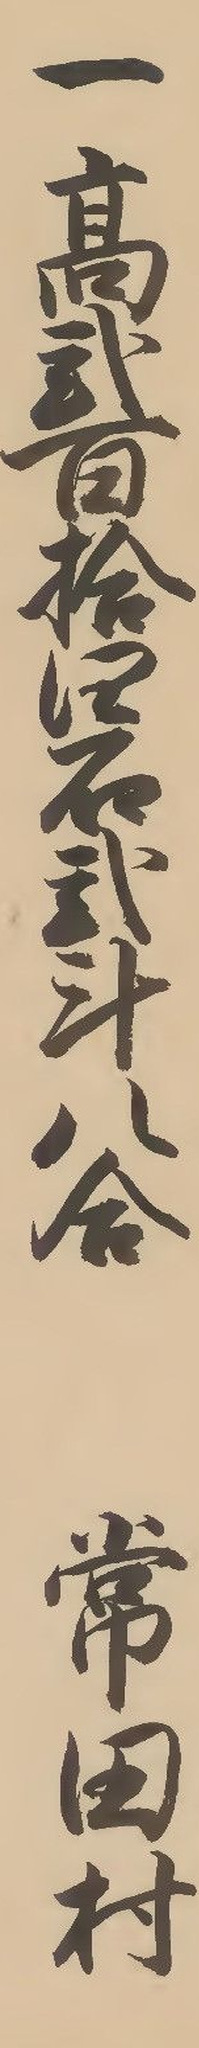一髙弐百拾四石弐斗八合常田村
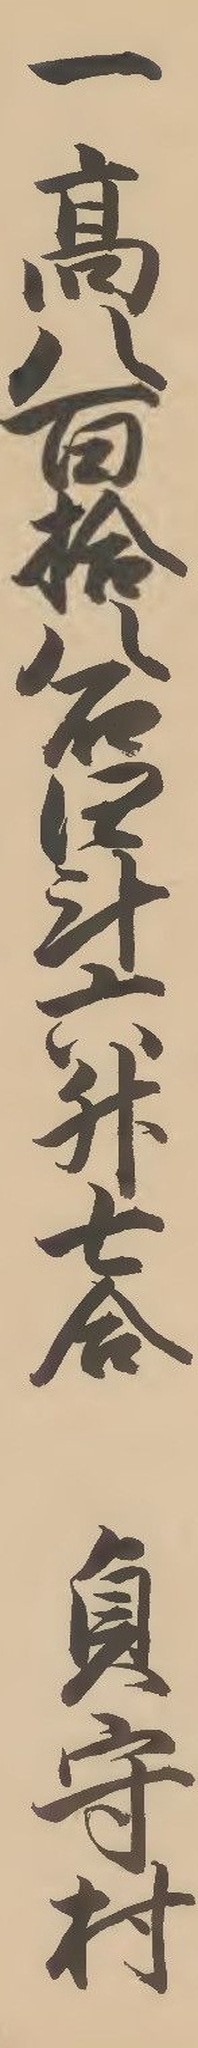一髙八百拾八石四斗六升七合負守村
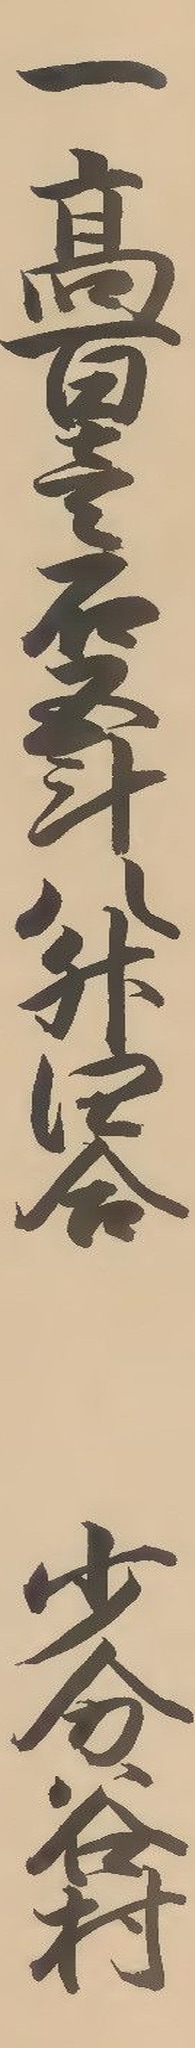一髙百壱石五斗八升四合少分谷村
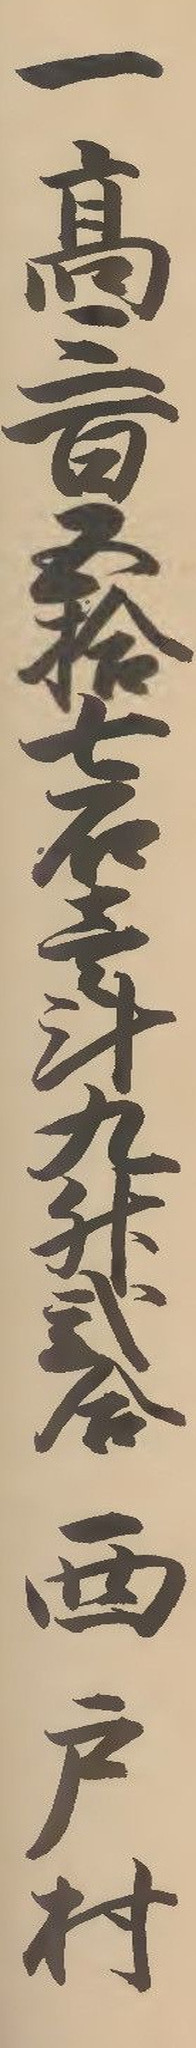一髙三百五拾七石壱斗九升弐合西戸村
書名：播磨国郷帳
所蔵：国立公文書館 National Archives of Japan
